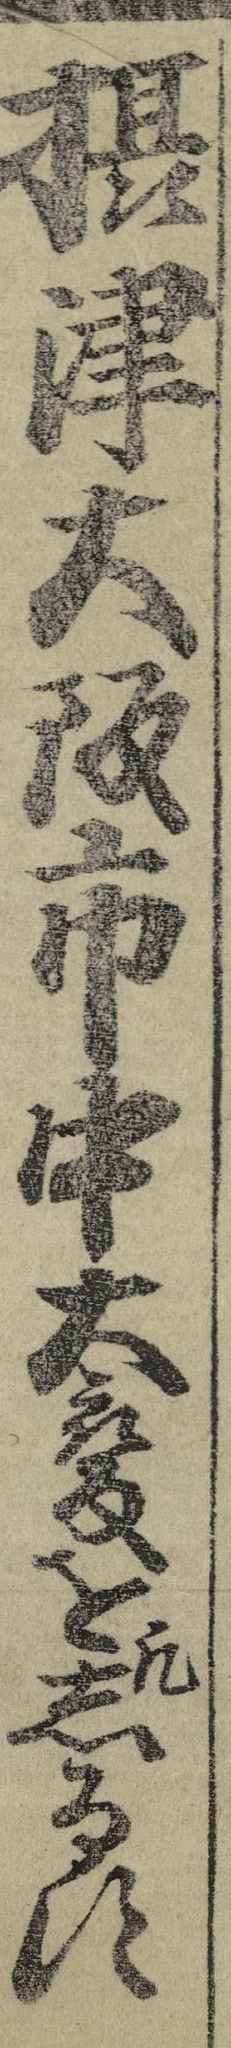摂津大阪市中大変を凡しるす
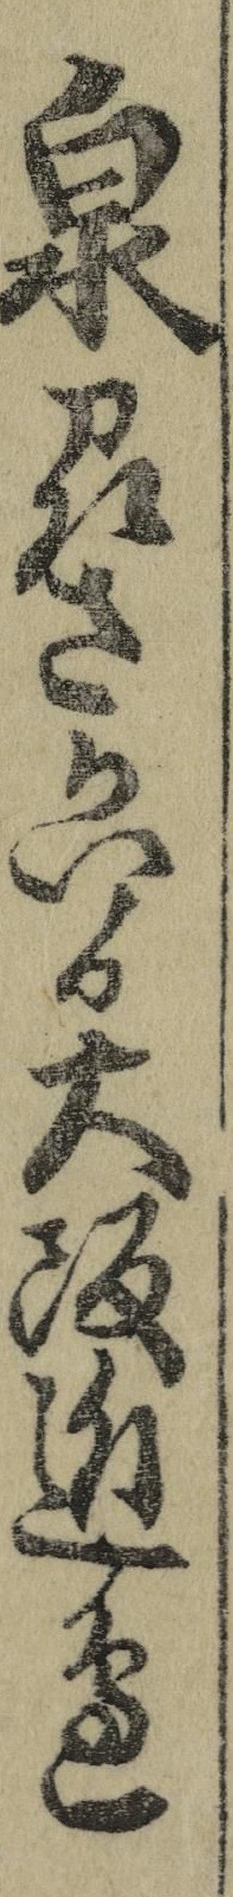泉州さかいゟ大阪近辺
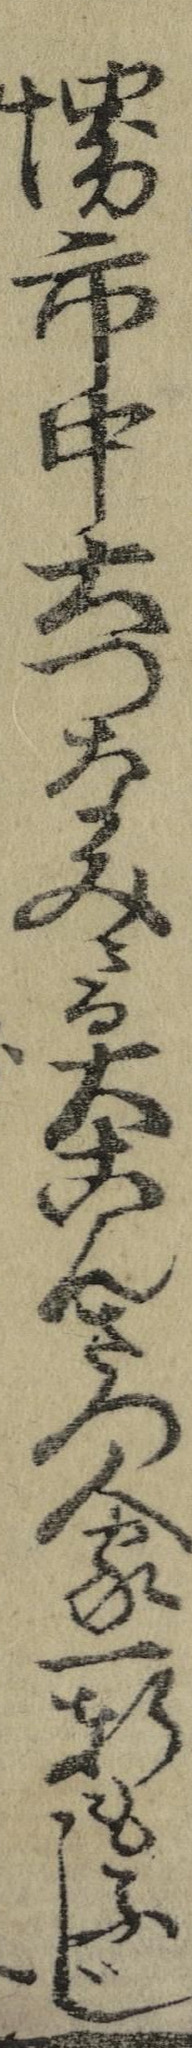堺市中大つなみに而大こんさつ人家一軒もふじ
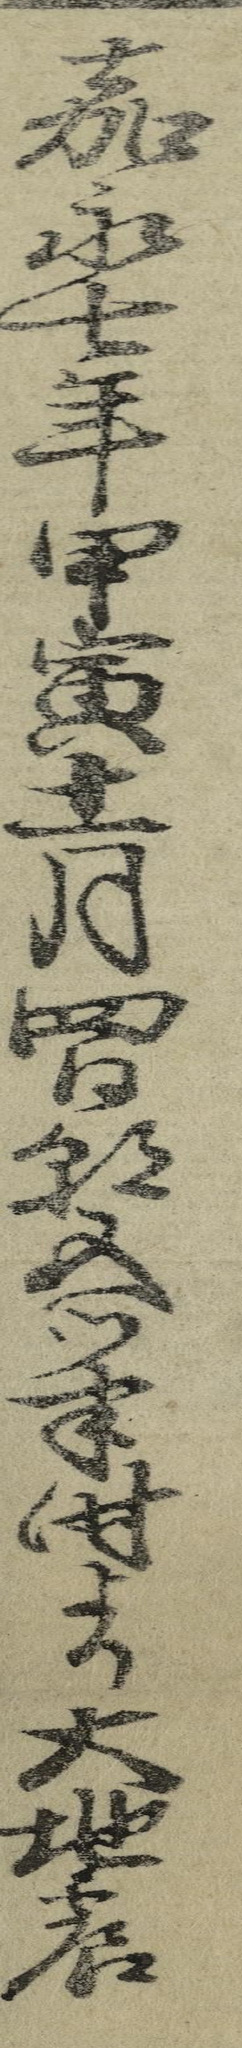嘉永七年甲寅十一月四日朝五ツ半時より大地震
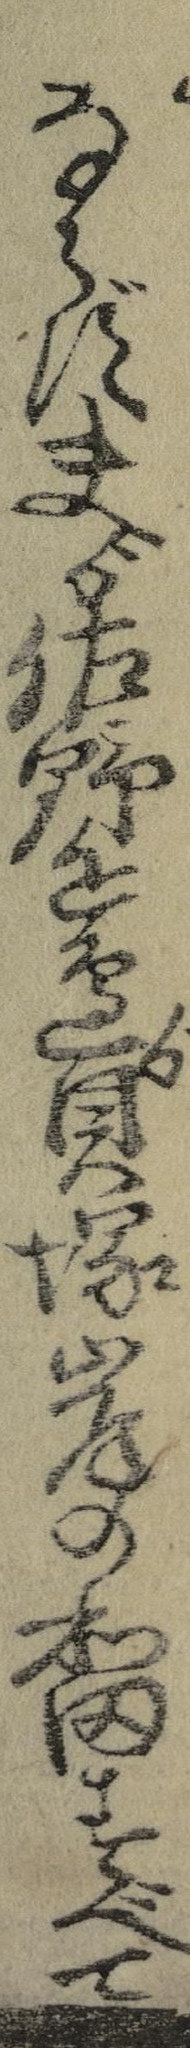ならず夫ゟ佐野近辺ゟ貝塚岸の和田すべて
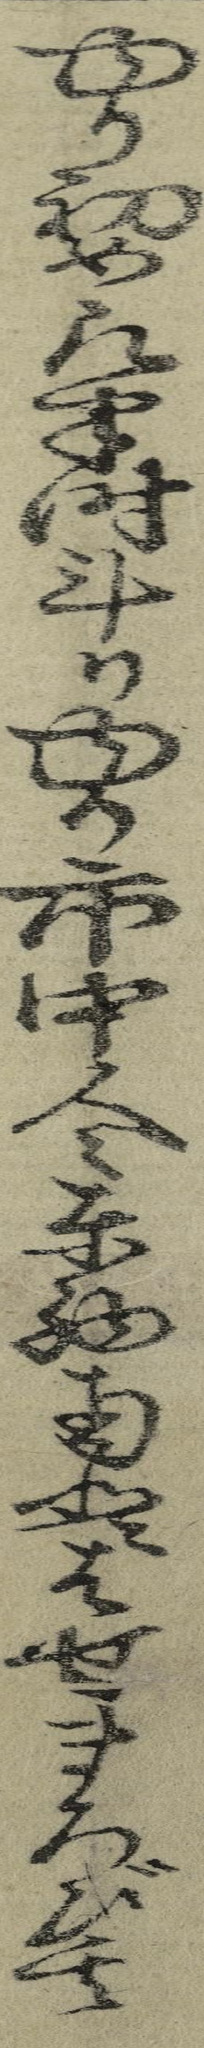ゆり初め凡半時計りゆり市中人〻東西南北にはせまろび其
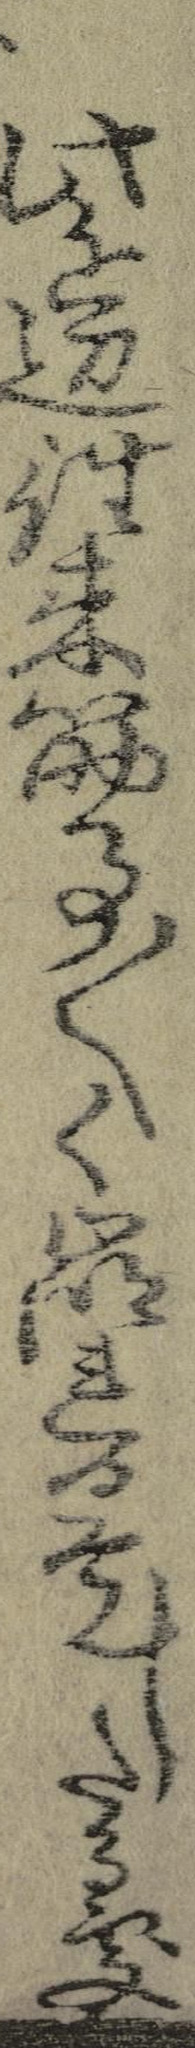此近辺往来筋事〳〵く崩れるそんしたる処
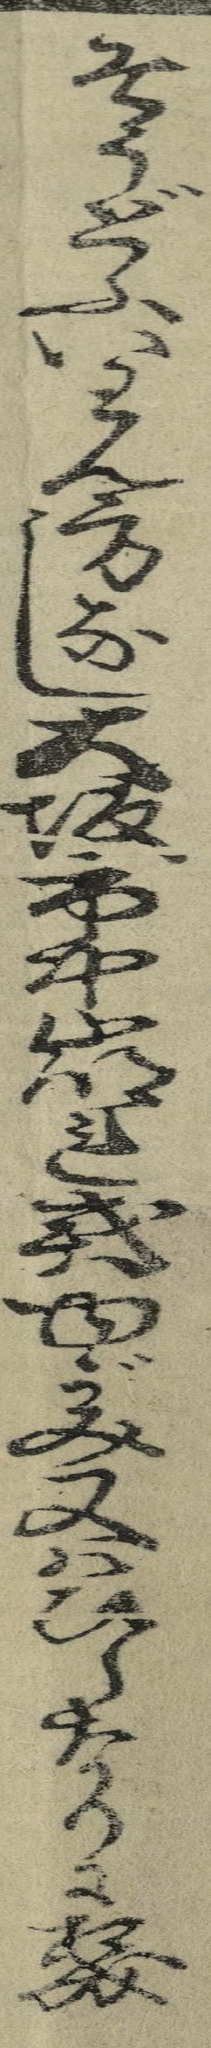そうどふいわん方なし大坂市中崩れ或ゆがみ又はひしなりに相成
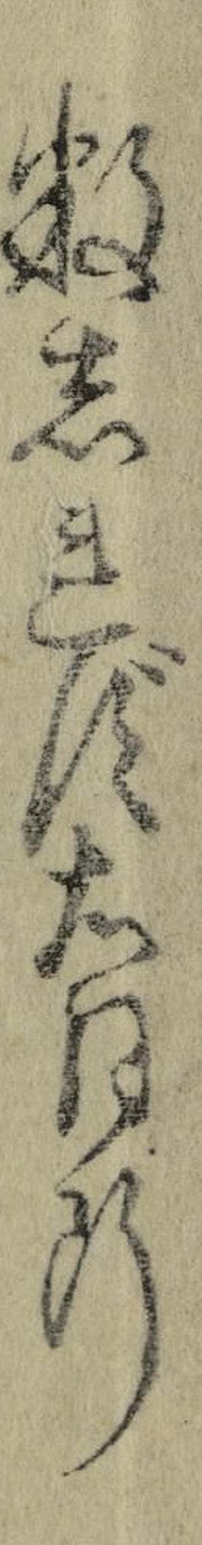数しれず右同断
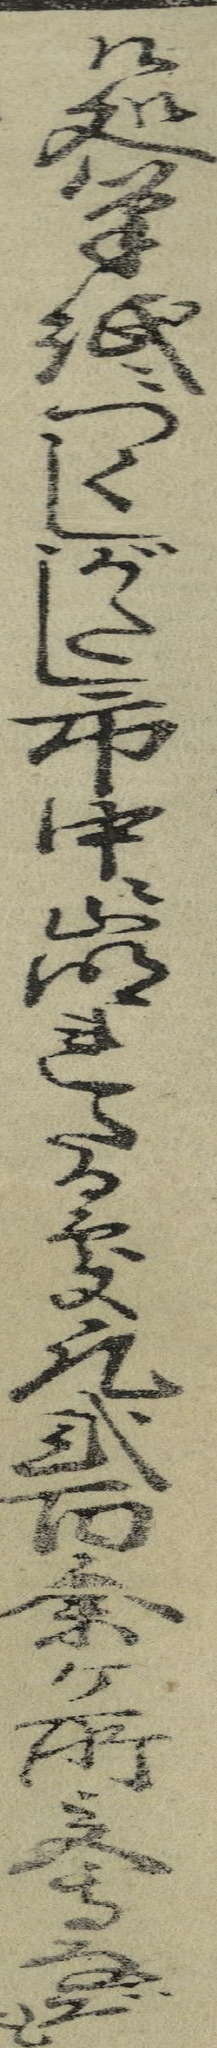候処筆紙につくしがたし市中に崩れたる処弐百余ケ所宮寺なども
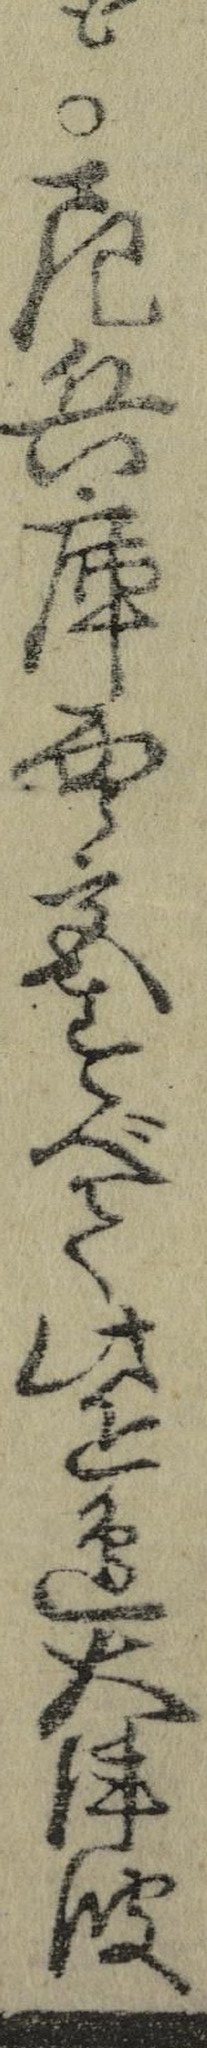〇尼兵庫西之宮すべて此近辺大津波
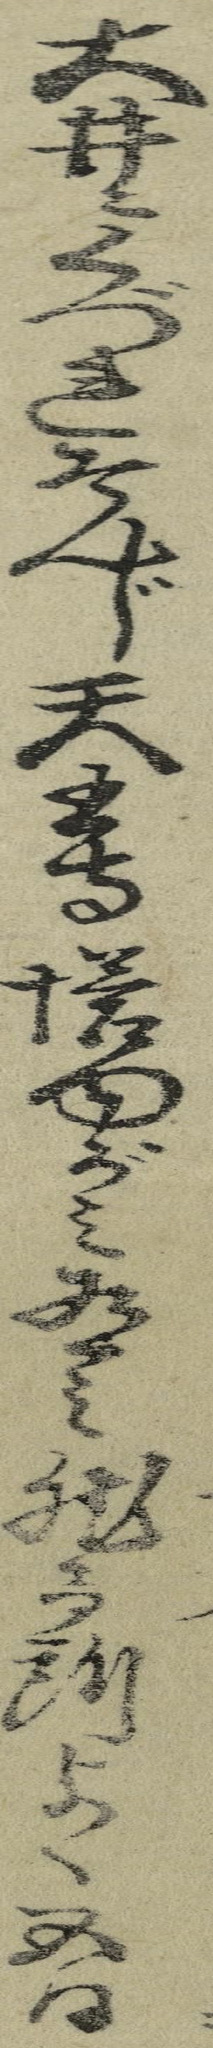大井にくづれそんじ天王寺塔ゆがみ有之然る所よく五日
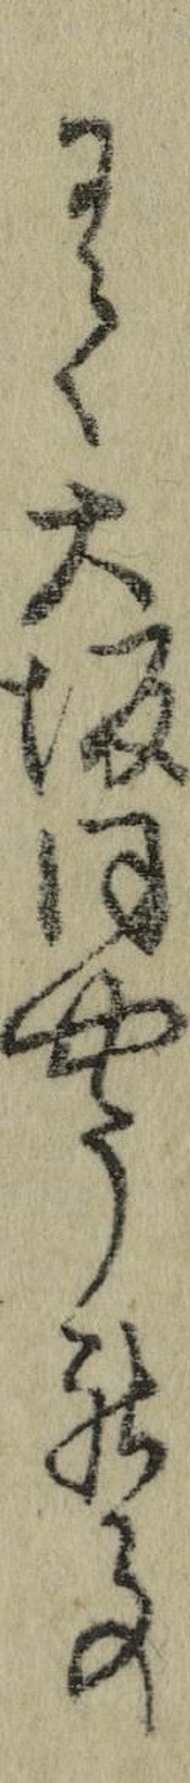にて大坂同やうの事
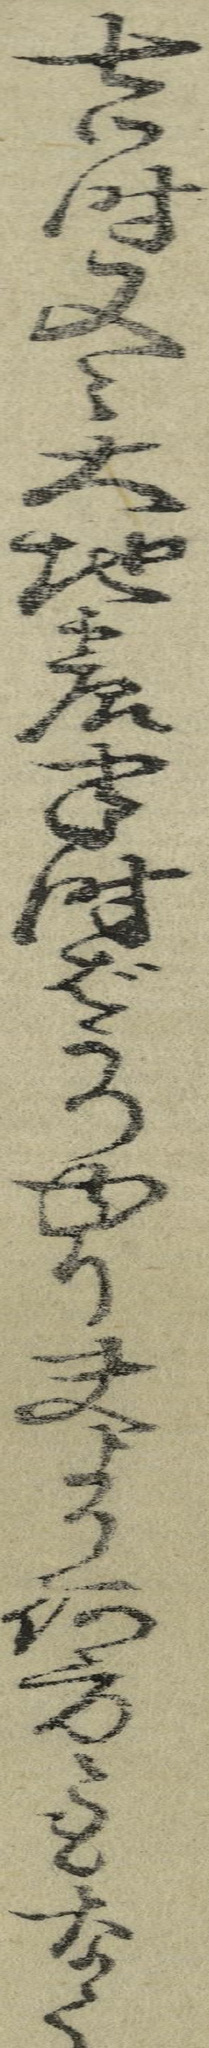七ツ時又〻大地震半時ばかりゆり夫より何方ともなく
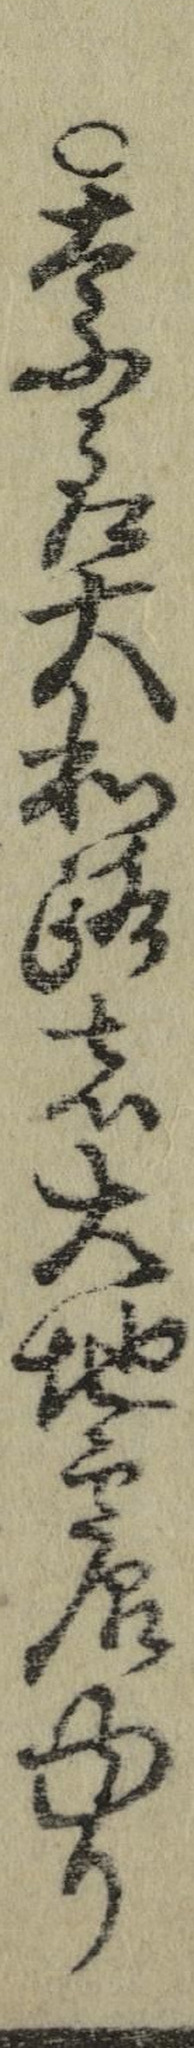〇奈良大和路は大地震ゆり
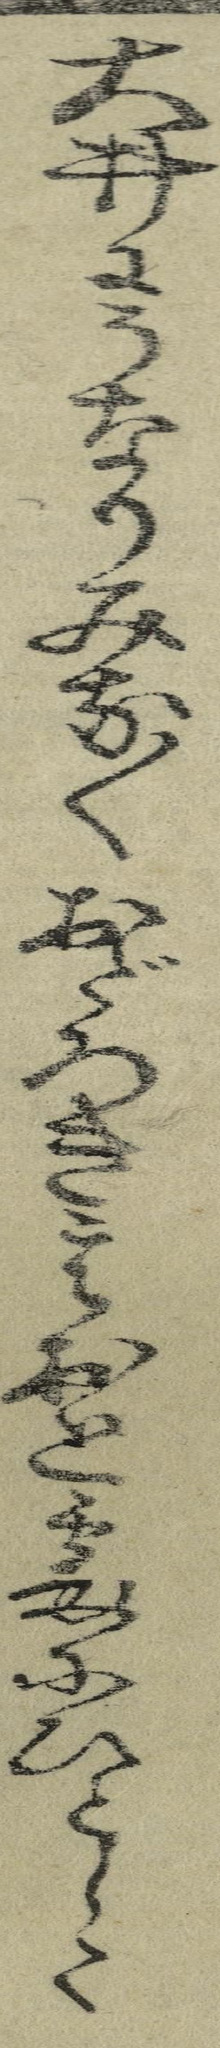大井にうなりみな〳〵おどろき其おと其如にひとしく
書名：摂津大阪近辺早引方角附　大地震ニ附大津波次第
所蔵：東京大学地震研究所図書室 Earthquake Research Institute Library, The University of Tokyo, JAPAN
